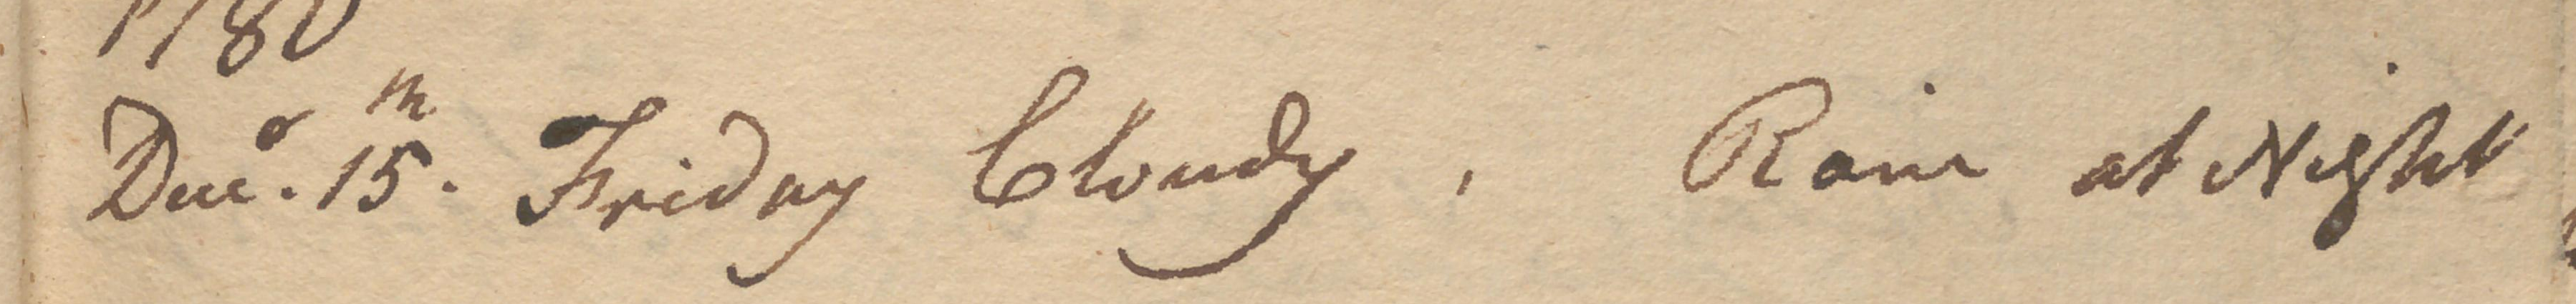Dec^r. 15^th. Friday Cloudy. Rain at Night
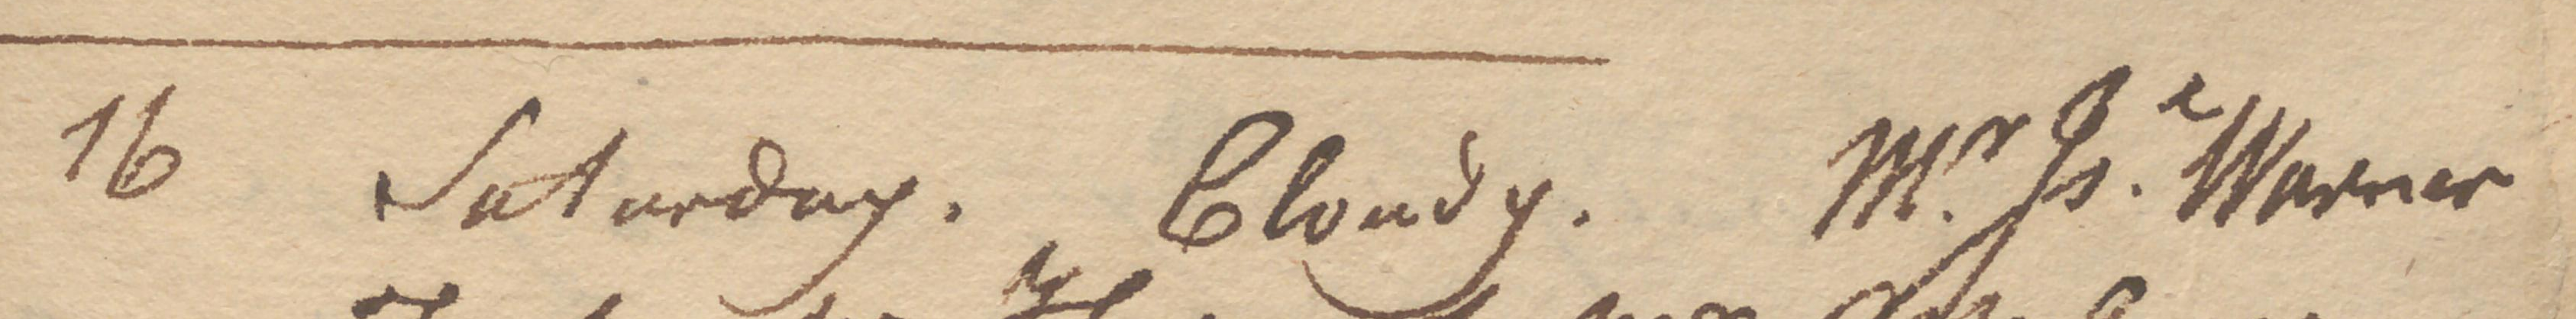16 Saturday. Cloudy. M^r. Is^l. Warner
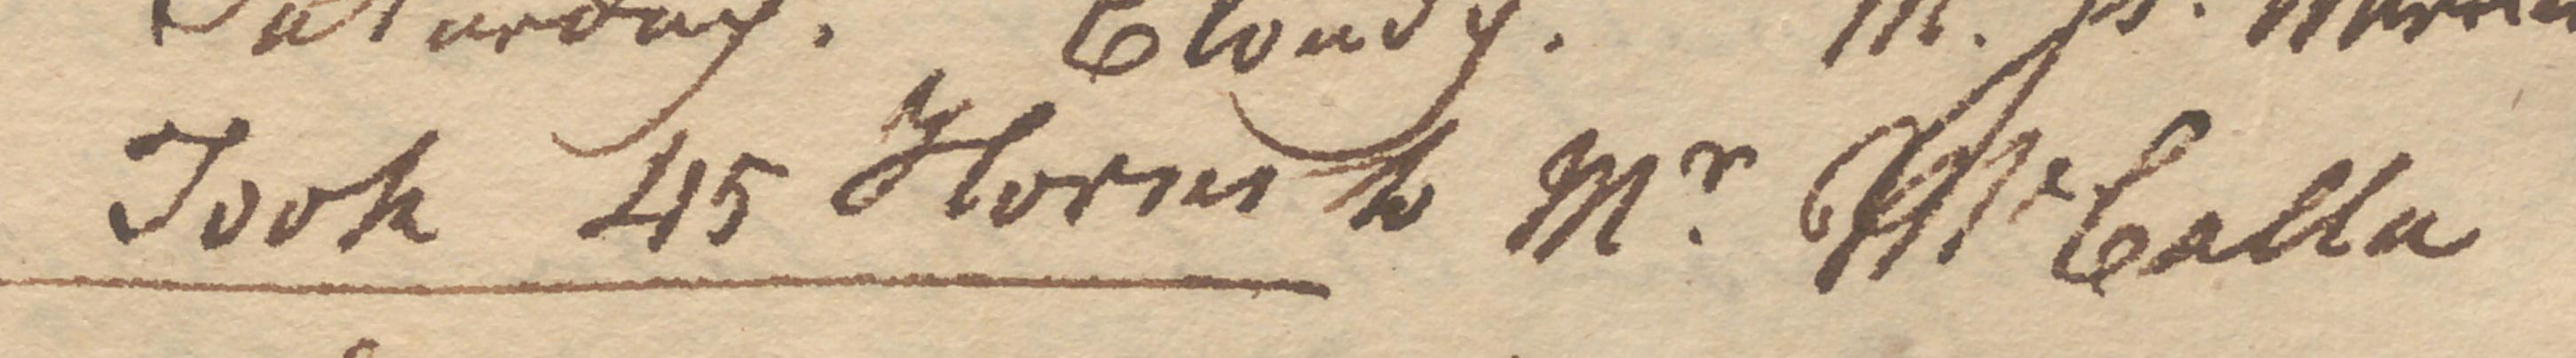Took 45 Horses to M^r. M^cCalla
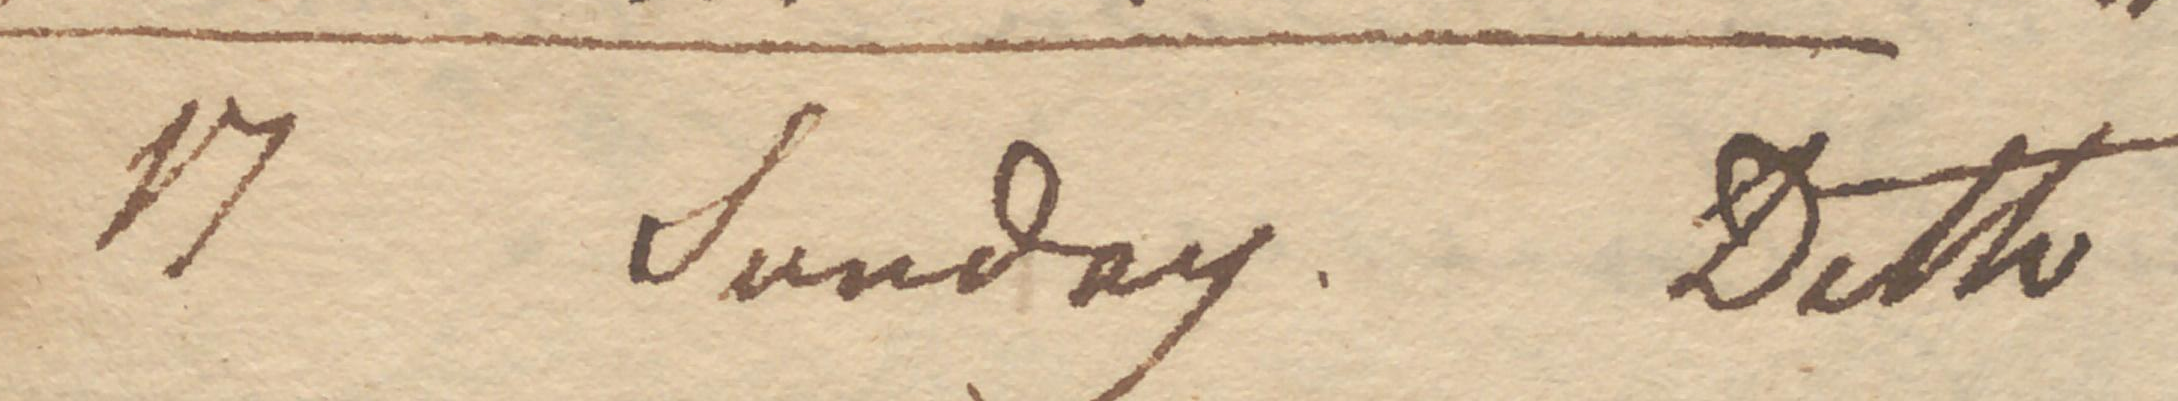Sunday. Ditto
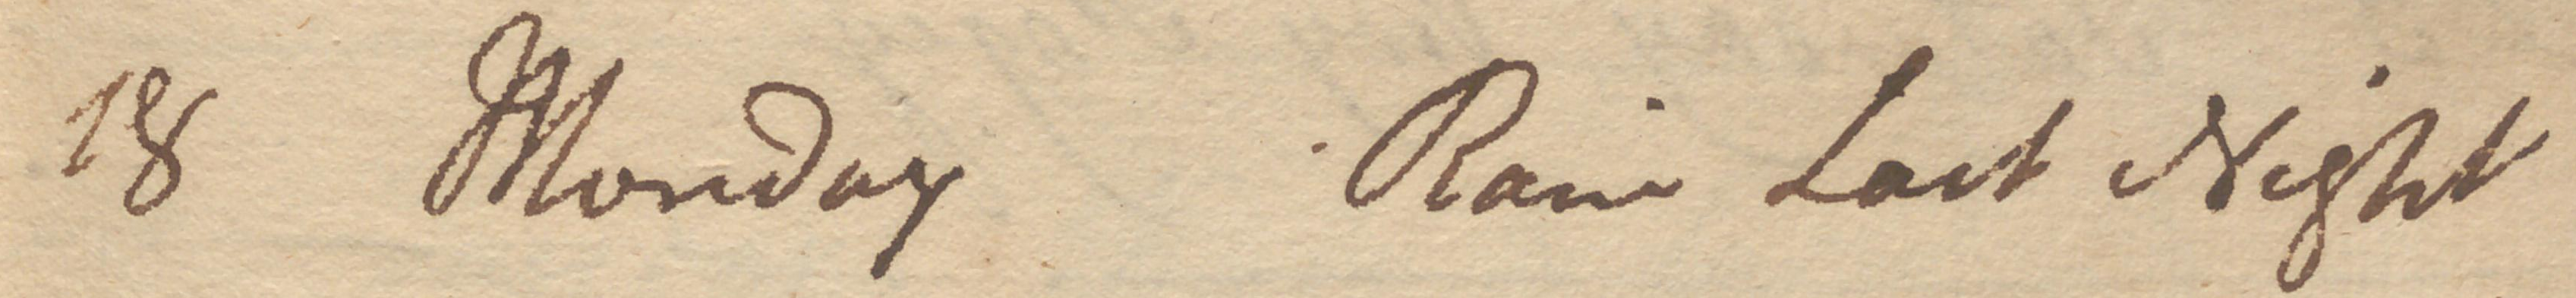18 Monday Rai Last Night
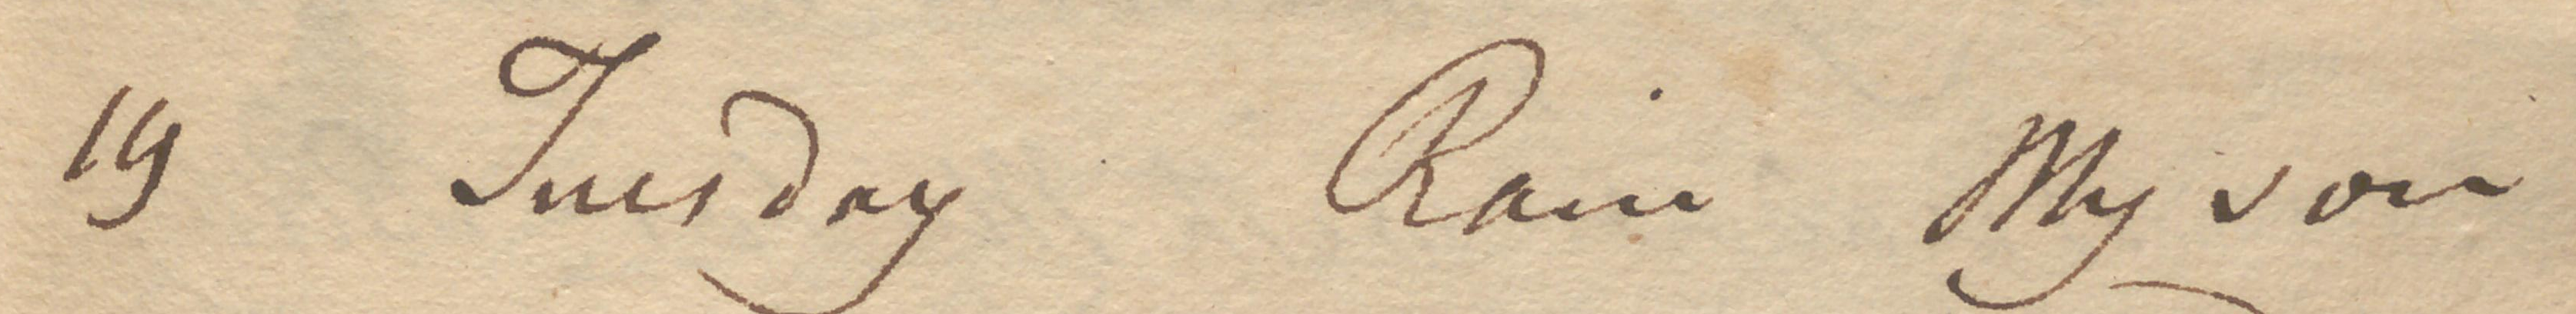19 Tuesday Rain, My son
